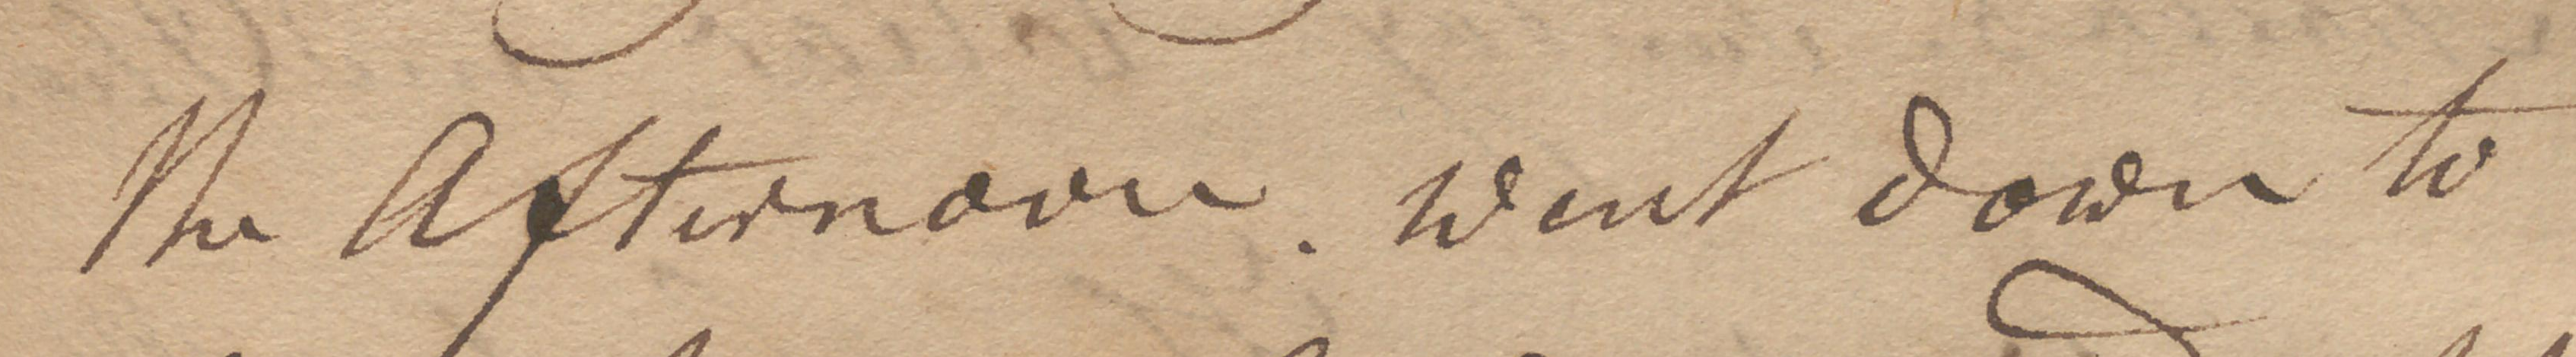The Afternoon went down to
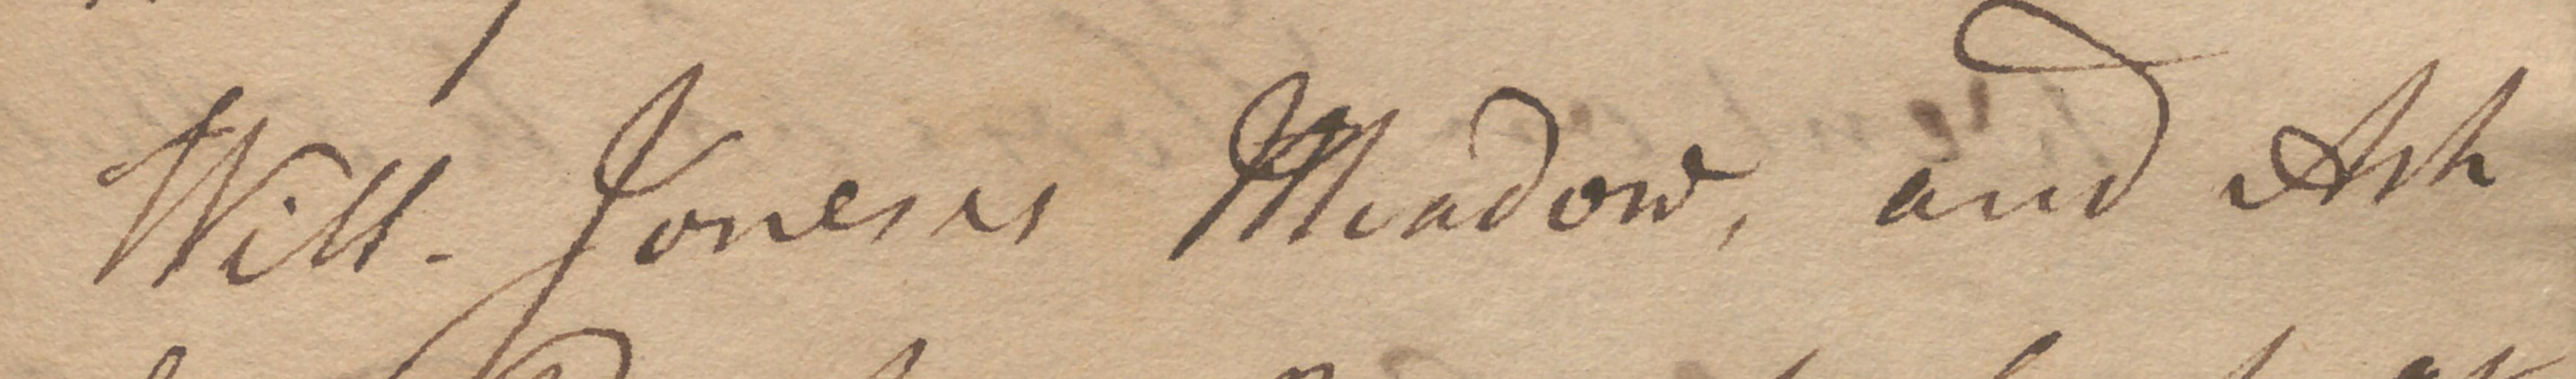Will. Joneses Meadow, and Ash
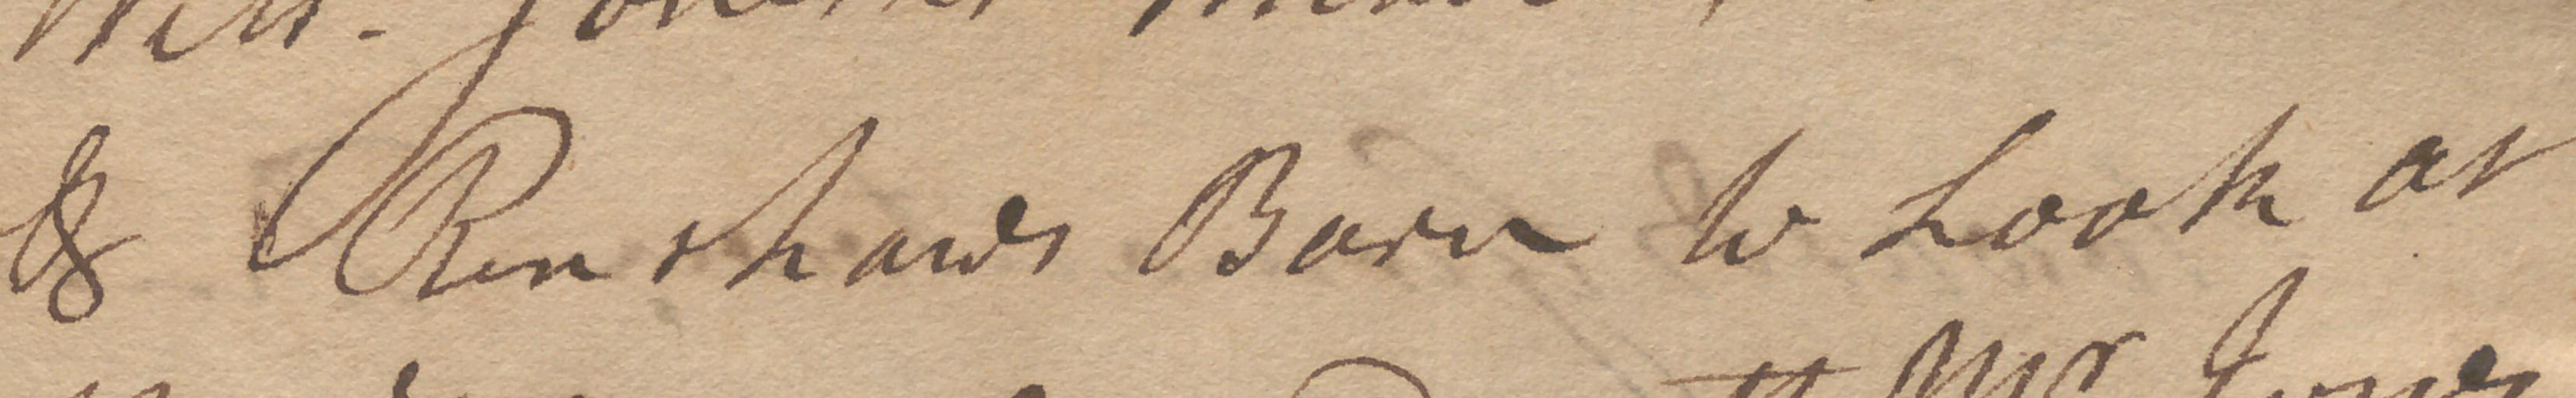& Renshaws Barn to Look at
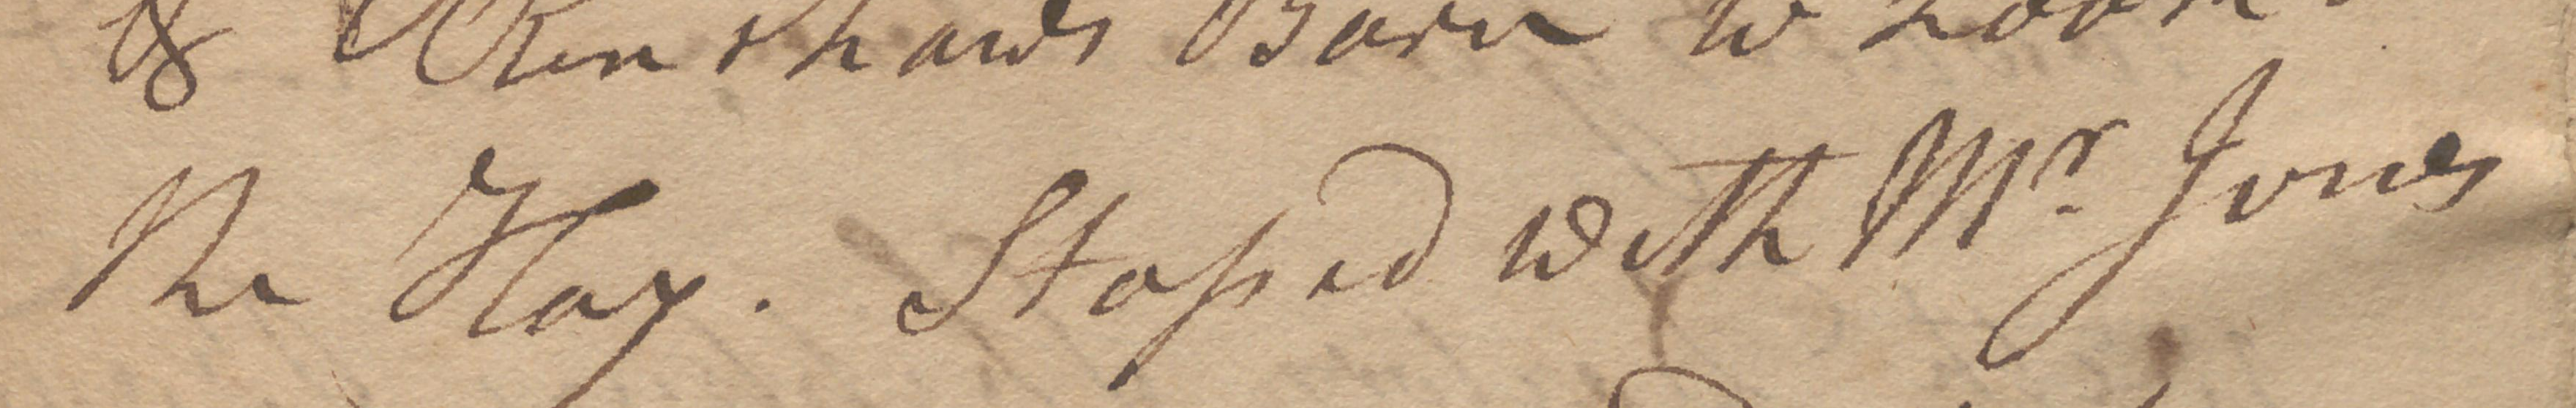the Hay. Stoped with M^r. Jones
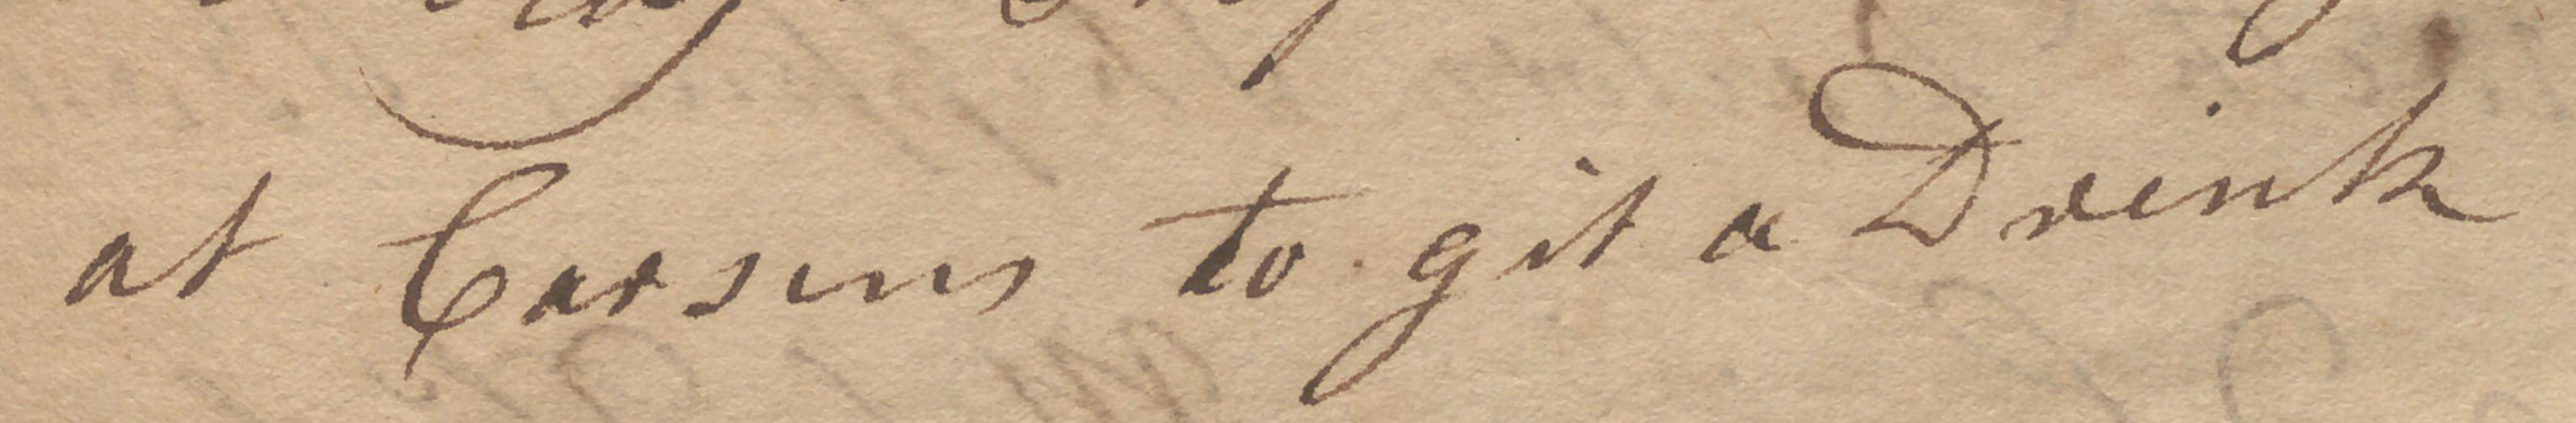at Carsens to git a Drink
